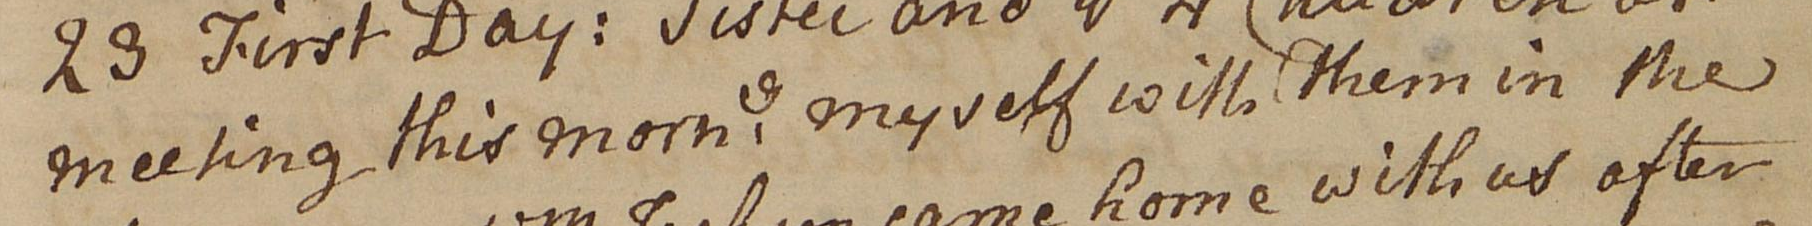meeting this morn^g. myself with them in the
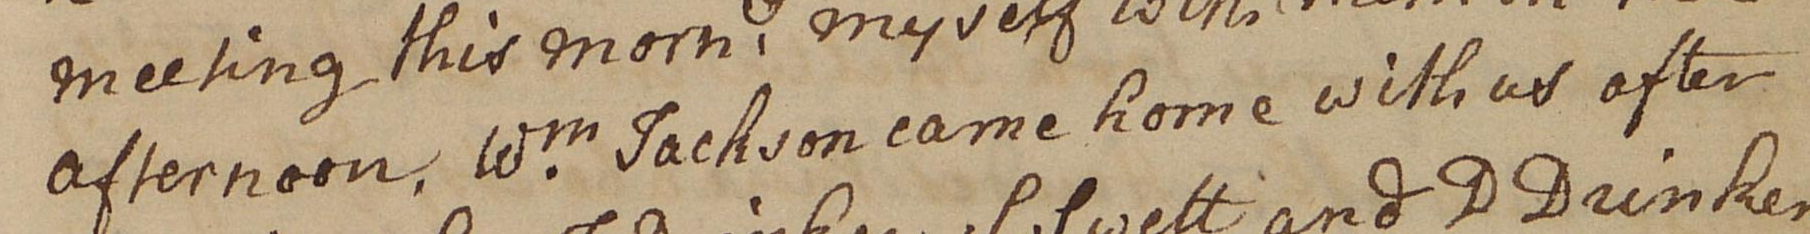Afternoon, W^m. Jackson came home with us after
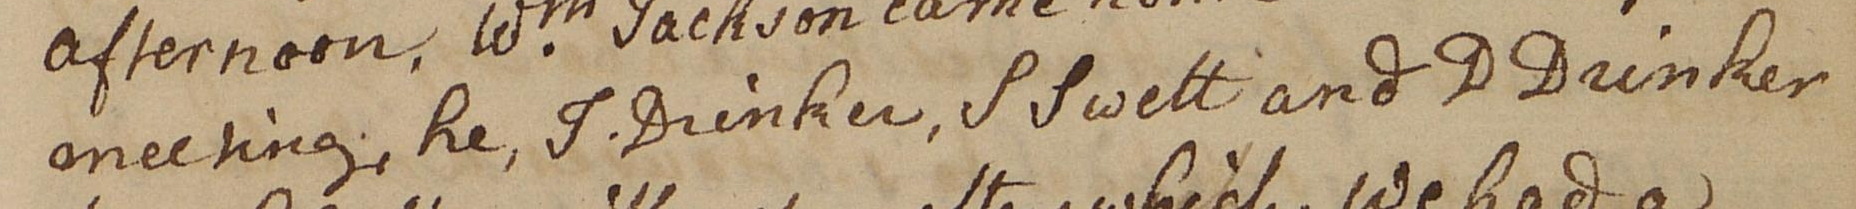meeting, he, J. Drinker, S Swelt and D Drinker
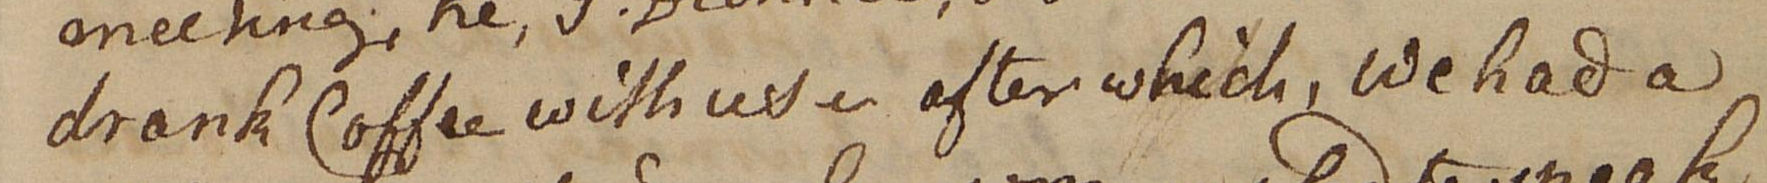drank Coffee with us- after which, We had a
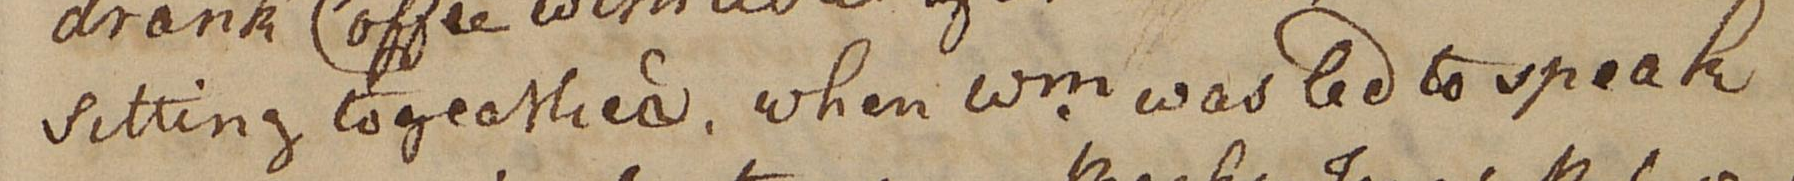sitting togeather, when W^m was led to speak
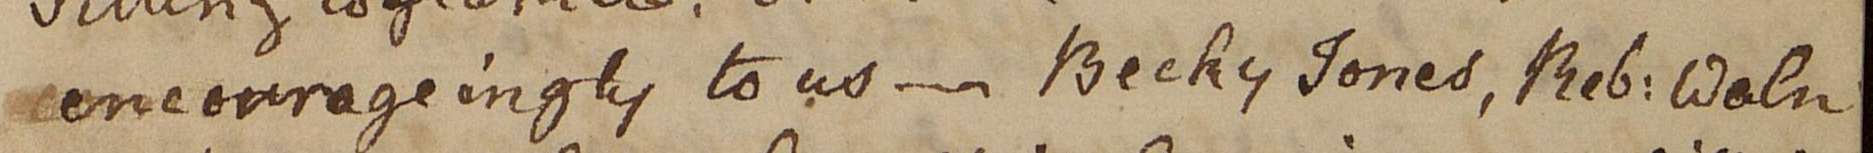encourageingly to us- Becky Jones, Reb: Waln
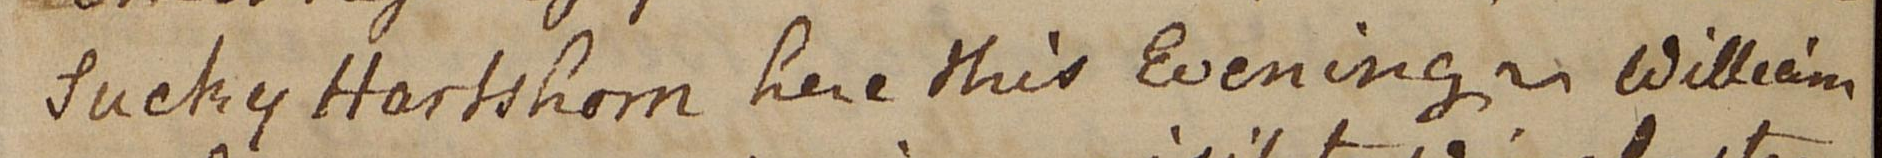Sucky Hartshom here this Evening - William
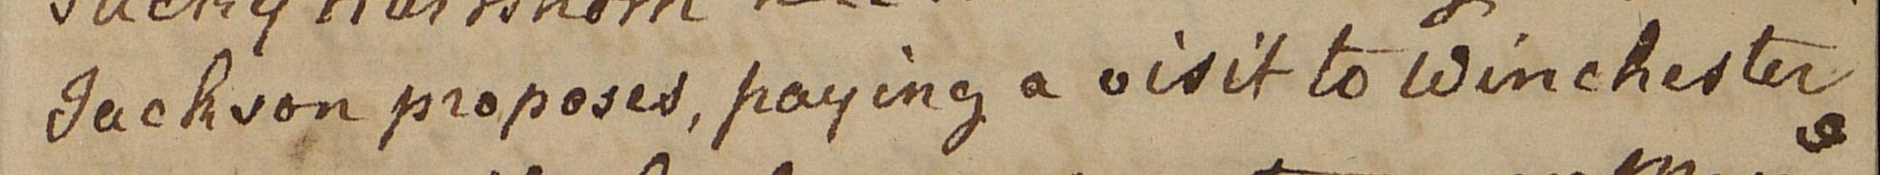Jackson proposes, paying a visit to Winchester
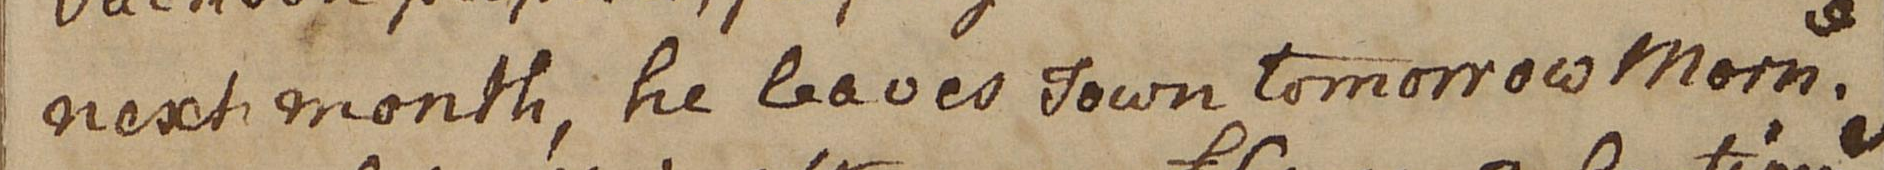next month, he leaves Town tomorrow Morn^g.
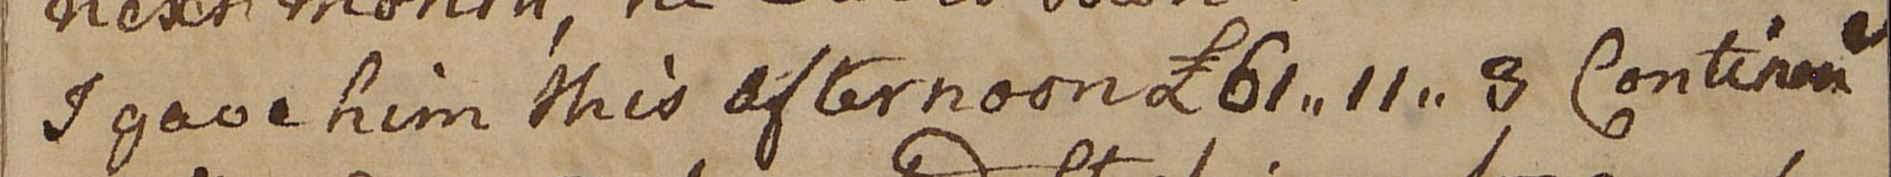I gave him this afternoon £61..11.. 3 Continen^l
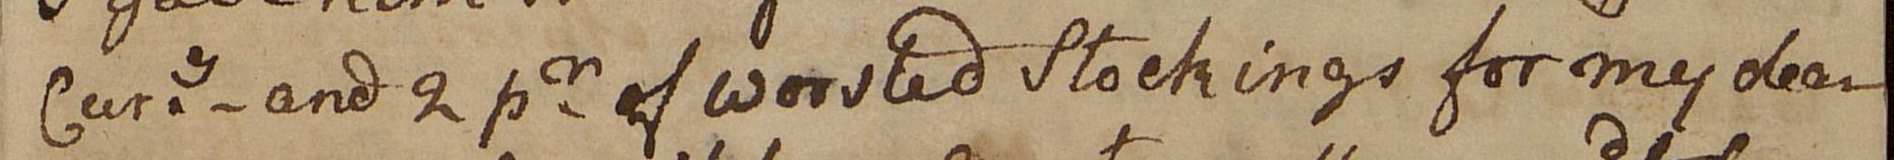Cur^y.- and 2 p^r of worsted Stockings for my dear
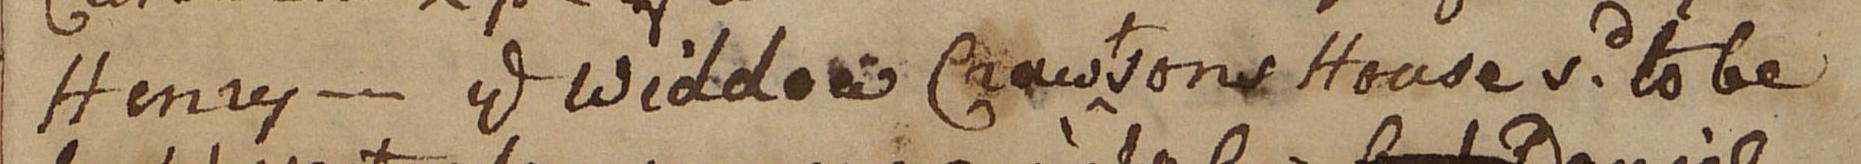Henry- y^e Widdow Craw^t sons House s^d. to be
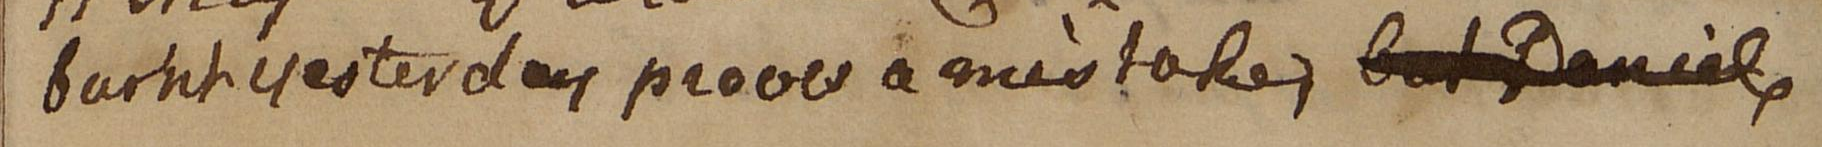burnt yesterday proves a mistake, but Daniel
